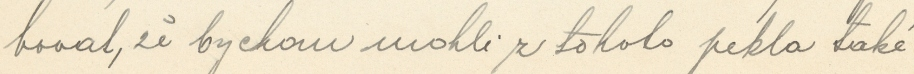bovat, že bychom mohli z tohoto pekla také
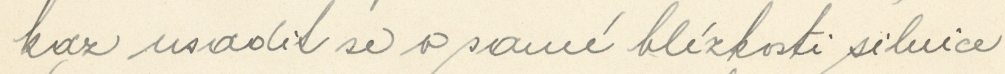kaz usadit se v samé blízkosti silnice
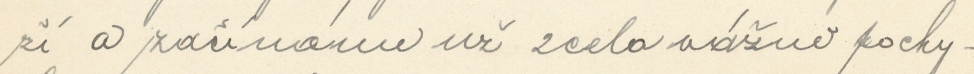ží a začínáme už zcela vážně pochy-
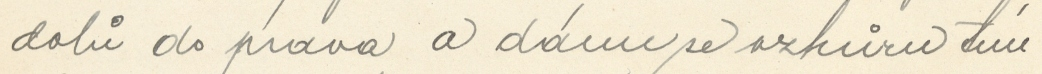dolů do prava a dáme se vzhůru tím-
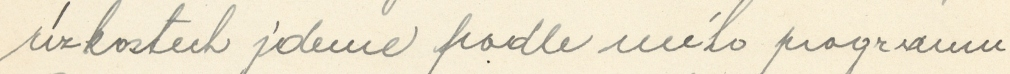úzkostech jdeme podle mého programu.
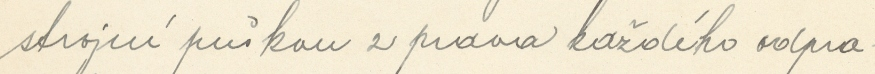strojní puškou z prava každého odpra-
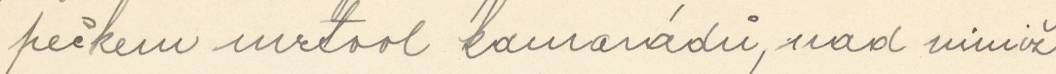pečkem mrtvol kamarádů, nad nimiž
